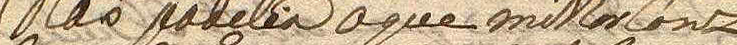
Naõ padecia o que milhor Conz
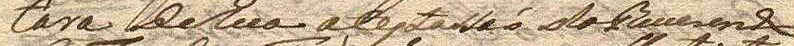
tara de hua atesttassaõ do Reuerendo
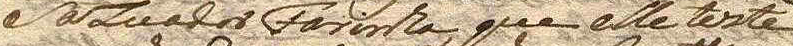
Saluador Farinha, que elle tezte
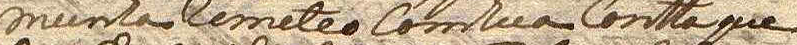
munha Remeteo com hua Contta que
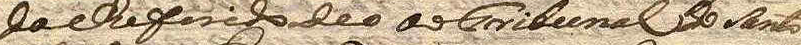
do Referido deo ao Tribunal do santo
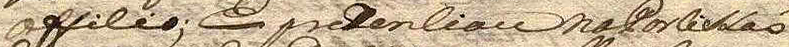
officio; E prezenciou na Porcissaõ
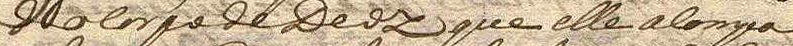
do corpo de Deoz que elle acompa
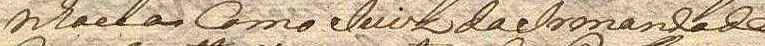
nhaua como Iuiz da Irmandade
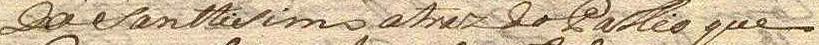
do Santtissimo atraz do Pallio que
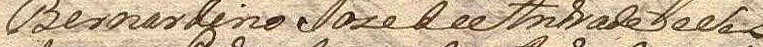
Bernardino Ioze de Andrade e seo
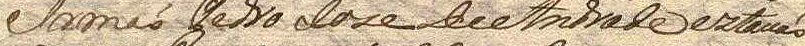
Irmaõ Pedro Ioze de Andrade eztauaõ
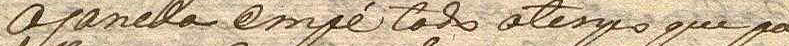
a janella em pé todo o tenpo que pa
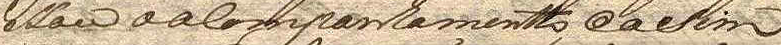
ssou o acompanhamentto, e aSim
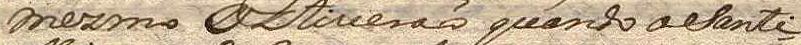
mezmo eztiueraõ quando o Santi
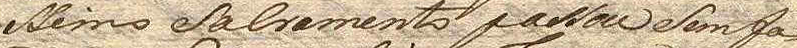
ssimo sacramento passou sem fa
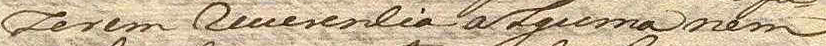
Zerem Reuerencia alguma nem
